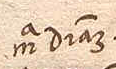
ma diāz
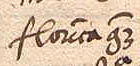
florēca ḡz
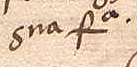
sua fa.
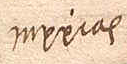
mxxias
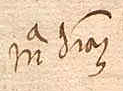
ma dīaz
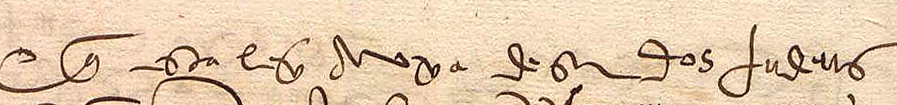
e q̄ esta ley Avya de ser dos Judeus
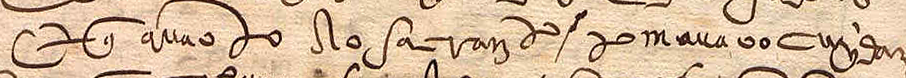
E q̄ quãoto Ao sacramto / tomaua oo Cuydar
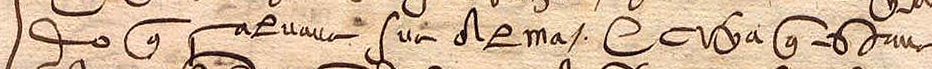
do q̄ saluaua sua Alma /. E crya q̄ estaua
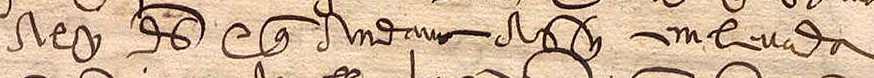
Aly ds̄ e q̄ Andaua Asy emleuada
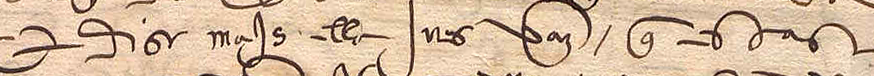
E dise maJs ella Jnes Vāz / q̄ estas
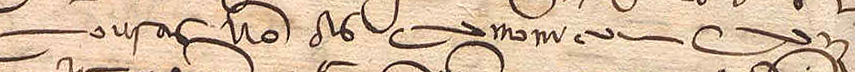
Cousas nō As comonicou Com
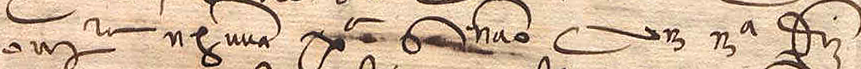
outra nhūua pa senão Com ma dīz
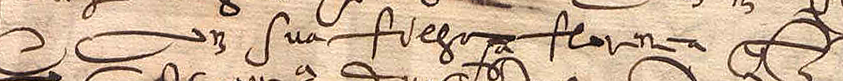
E Com sua filha a florença gz̄
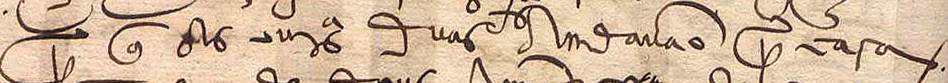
p̄o q̄ As outsa duas Amdauão p̄o casa /.
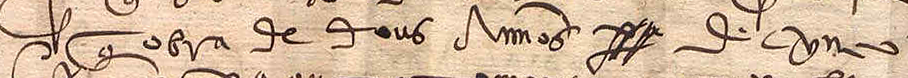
E q̄ obra de dous Ann̄os ꝑa de cynco
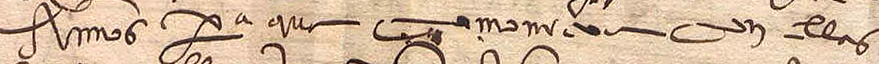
An̄nos ꝑa que comonicou com ellas
